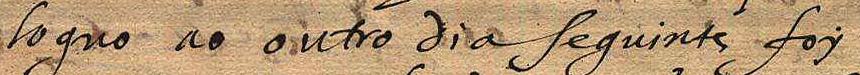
loguo ao outro dia seguinte foy
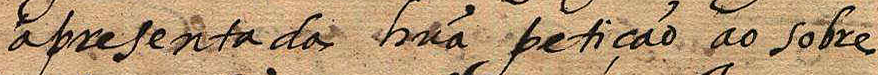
apresentada huā petição ao sobre
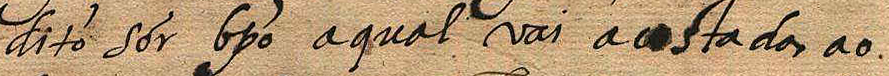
ditō sor̄ bpō a qual vai acostada ao
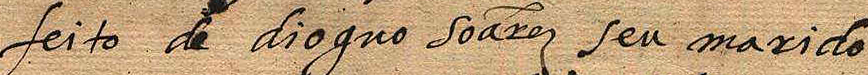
feito de dioguo soaraz seu marido
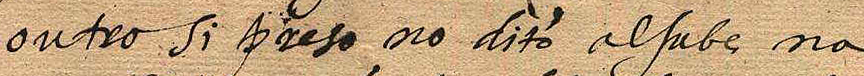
outro si preso no ditō alJube na
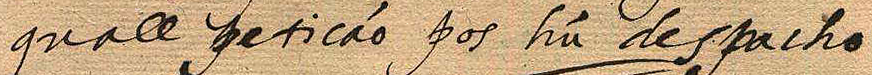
quall peticão pos hū despacho
